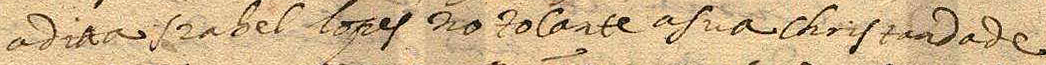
a ditta Jzabel lopes no tocante a sua christandade
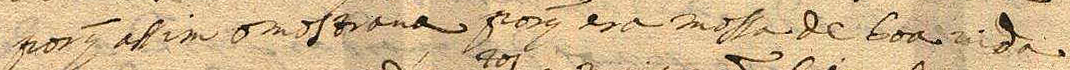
porq̄ assim o mostraua, porq̄ era mossa de boa uida
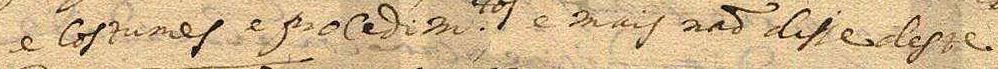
e costumes e procedim.tos, e mais não disse deste.
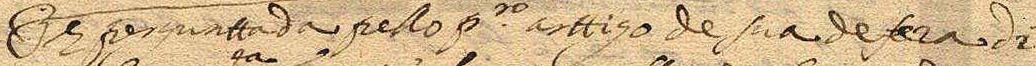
item E pergunttada pello p.ro arttigo de sua defeza di
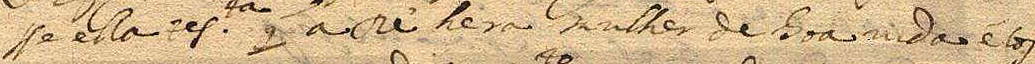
sse ella tes.ta q̄ a Ré hera mulher de boa uida e cos
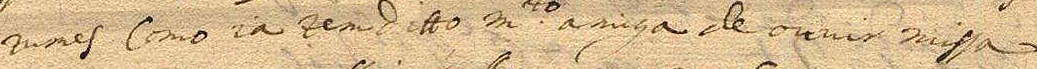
tumes Como ia tem ditto, mto. amiga de ouuir missa
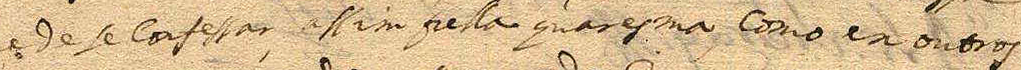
e de se confessar, assim pella quaresma, como en outros
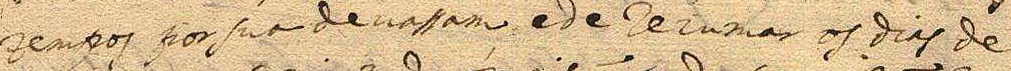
tempos por sua deuassam, e de Ieiumar os dias de
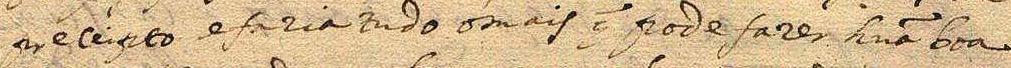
preceipto, e fazia tudo o mais q̄ pode fazer huā boa
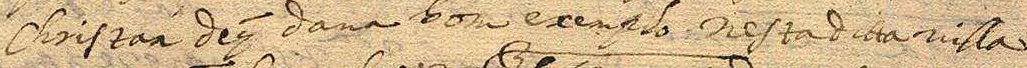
Christan de q̄ daua bom exemplo nesta ditta uilla.
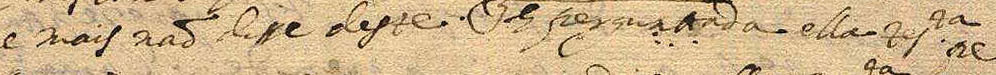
e mais não disse deste. item E pergunttada ella testa. pe
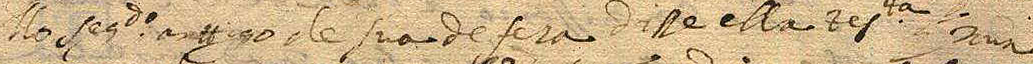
llo segdo. arttigo de sua defeza, disse ella testa. _ nun
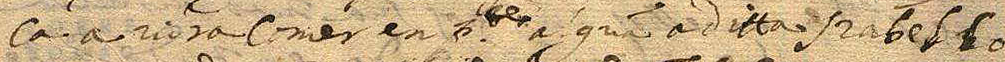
ca a uira Comer en p.te alguā a ditta Jzabel lo
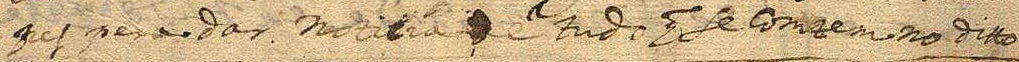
pes pera dar noticia _e tudo q̄ se comtem no ditto
